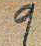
9
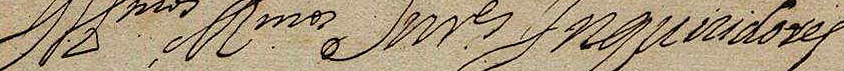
Jllmos Rmos Snr.es Jnquizidores
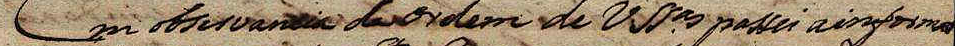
Em observancia da ordem de V.ss.as passei a informa
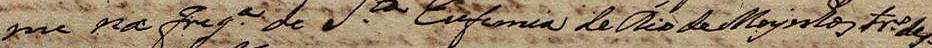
me na Freg.a de S.ta Eufemia de Rio de Moynhos tr.o des
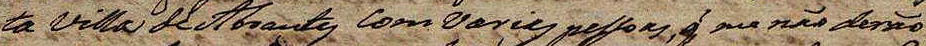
ta villa de Abrantes com varias pessoas, q̄ me não derão
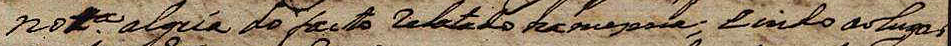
not.a alguā do facto Relatado na mesma; hindo ao Lugar
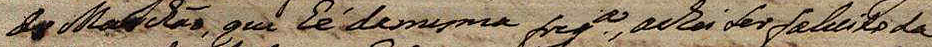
d_ Marchão, que hé da mesma freg.a, achei ser falecido da
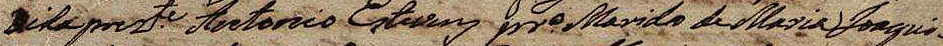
_ida prez.te Antonio Estevens pr.o Marido de Maria Joaqui
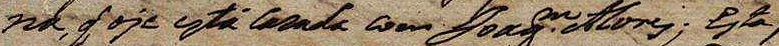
na, q̄ oje está cazada com Joaqm. Alvres; Esta
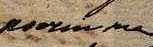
proxinma
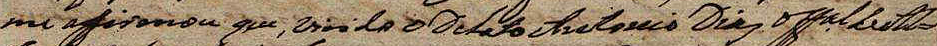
me affirmou que, vindo o Delato Antonio Dias off.al de AL
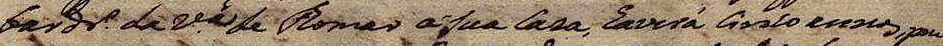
bardr.o da v.a de Thomar á sua caza, haverá cinco annos, pou
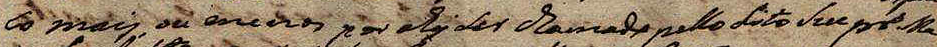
co mais, ou menos por ahy ser chamado pello dito seu pr.o Ma
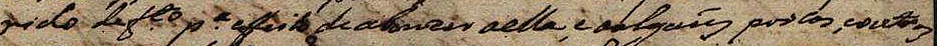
rido def.to p.a effeito de a benzer a ella, e a alguñs porcos, e outros
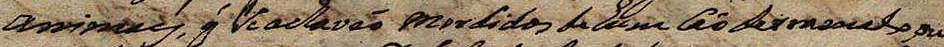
animaes, q̄ se achavaõ mordidos de hum Cão derramado, ou
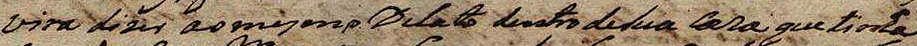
vira dizer ao mesmo Delato dentro de sua Caza que tinha
